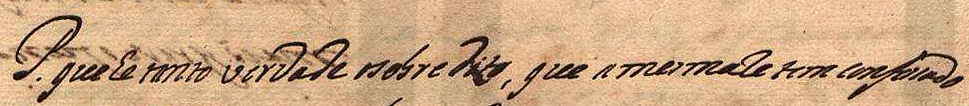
P. que he tanto verdade o sobredito, que a mesma Re tem confessado
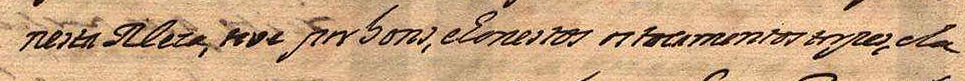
nesta Meza, teve por bons, e honestos os tocamentos torpes, e la
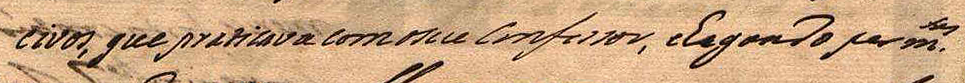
civos, que praticava com o seu Confessor, chegando por m.tas
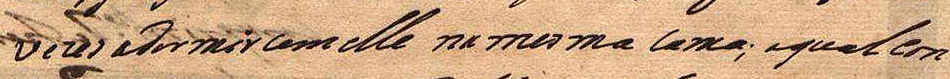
vezes a dormir com elle na mesma cama; a qual con
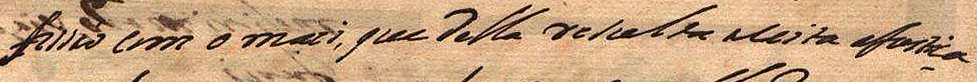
fissaõ com o mais, que della resulta aceita a Justiça
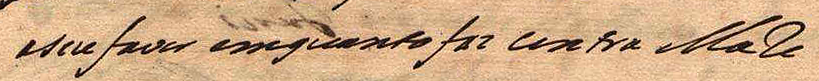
a seu favor emquanto faz contra ella Re
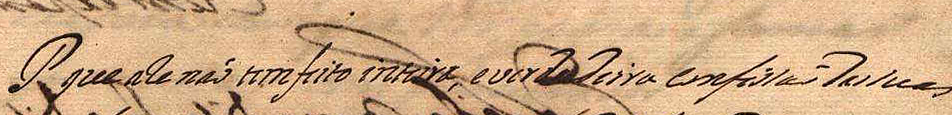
P. que a Re naõ tem feito inteira, e verdadeira confissaõ das suas
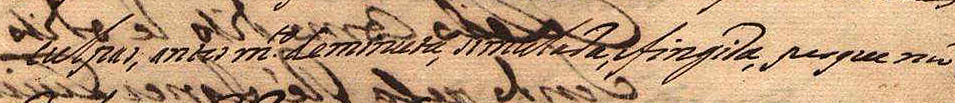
culpas, antes m.to deminuta, simulada, e fingida, porque naõ
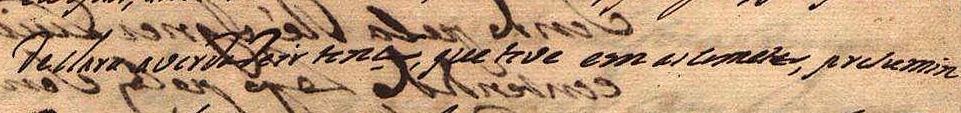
declara a verdadeir tençaõ, que teve em as cometer, presumin
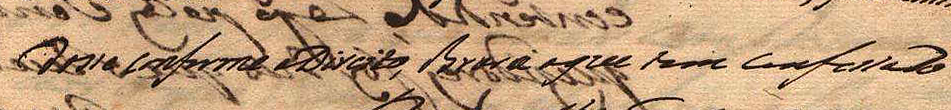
dosse conforme o Direito, obrara o que tem confessado
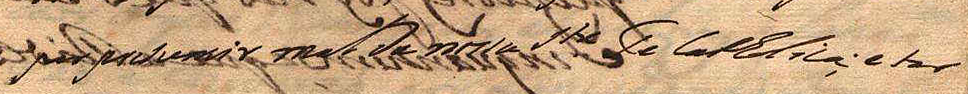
por presumir mal de nossa S.ta Fe Catholica; e tor
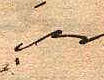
ser
